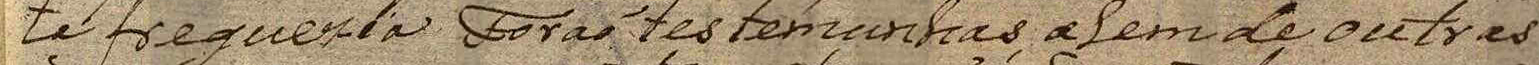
ta freguezia Foraõ testemunhas, aLem de outras
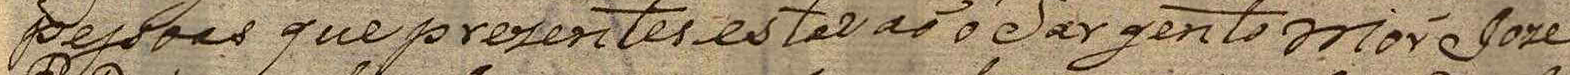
pessoas que prezentes estavaõ o Sargento mór Joze
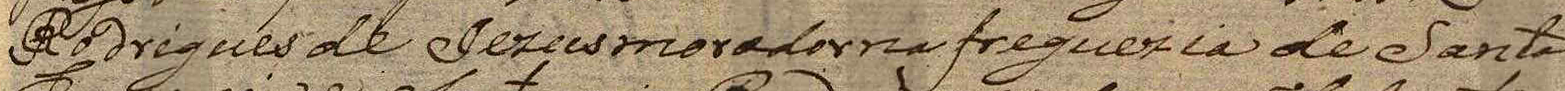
Rodrigues de Jezus morador na freguezia de Santa
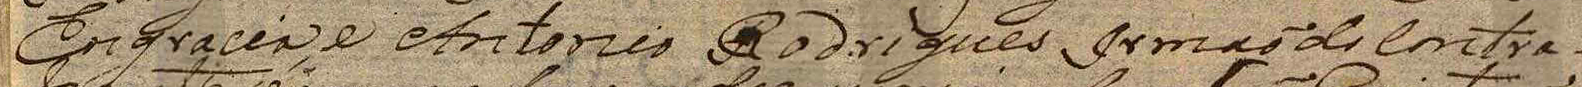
Engracia, e Antonio Rodrigues Jrmaõ do Contra
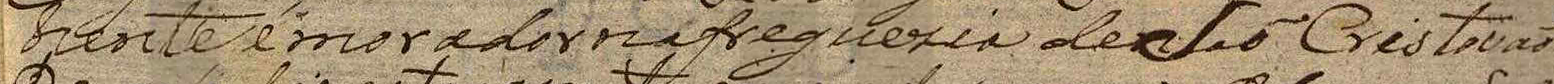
hente e morador na freguezia de Saõ Cristovaõ
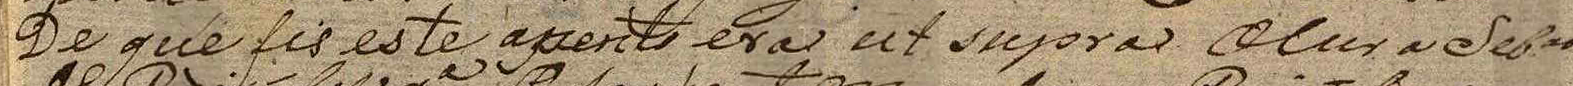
De que fis este assento era ut supra O cura Seb.ao
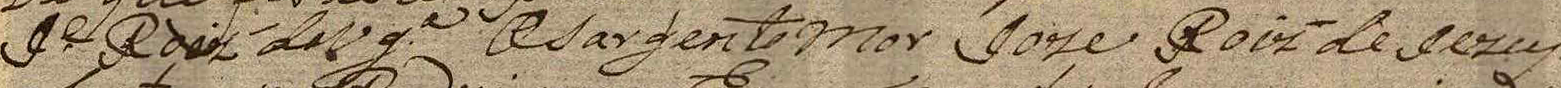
J.e Roiz̄ da Vg.a O Sargento mor Joze Roiz̄ de Jezus
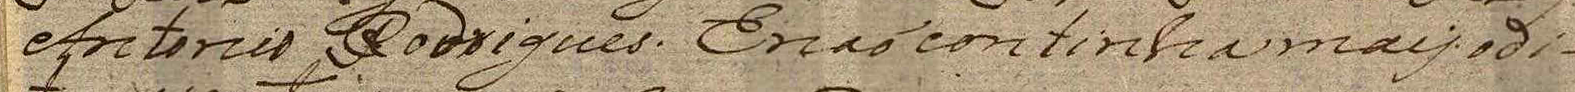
Antonio Rodrigues. E naõ continha mais o di
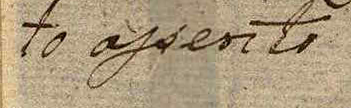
to assento
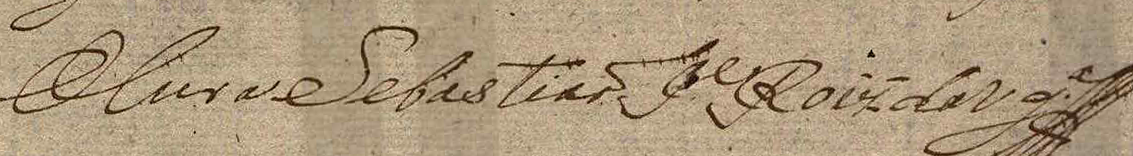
O Cura Sebastiaõ Je Roiz̄ da Vg.a
